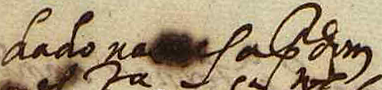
dado na _esa p̄ dom
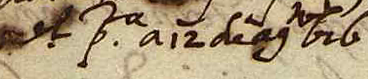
mel p.ra a 12 de agto 616
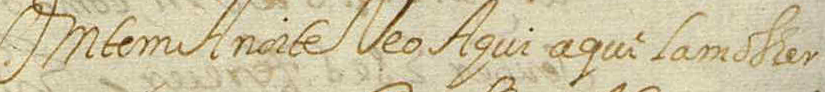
Omtem A noite Veo Aqui aquela molher
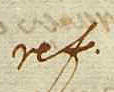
ref.
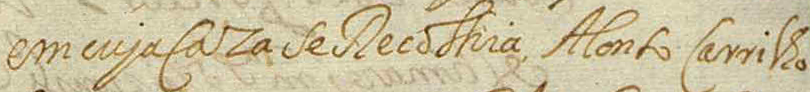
em cuja Caza Se Recolhia, Alonso Carrilho
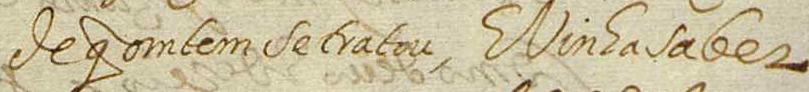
de q̄ omtem Se tratou, E Vinha saber
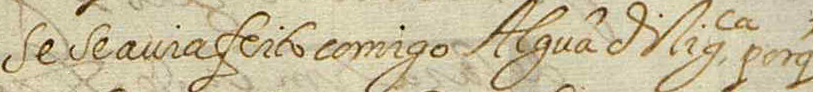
Se Se auia feito comigo Alguā dilig.ça porq̄
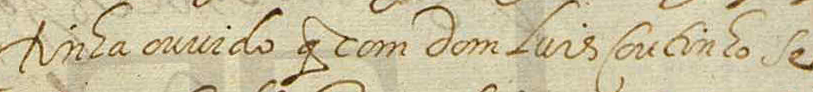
tinha ouuido q̄ com dom Luis Coutinho Se
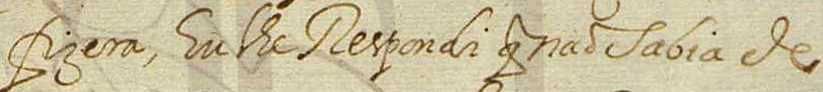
fizera, Eu lhe Respondi q̄ naõ Sabia de
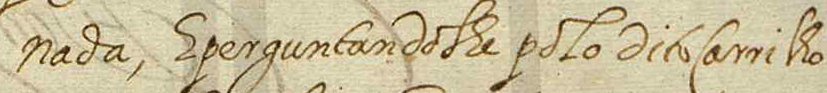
nada, E perguntandolhe polo dito Carrilho
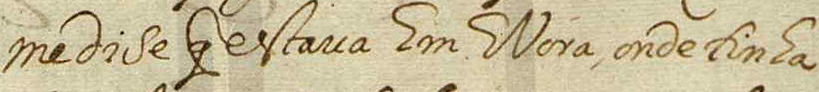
me diSe q̄ estaua Em EVora, onde tinha
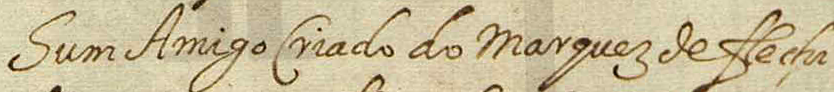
hum Amigo Criado do marquez de flechi
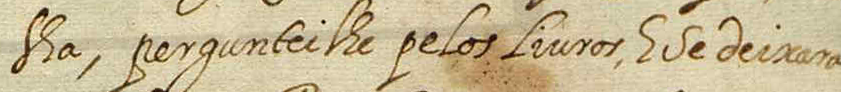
lha, perguntei lhe pelos Liuros, E Se deixara
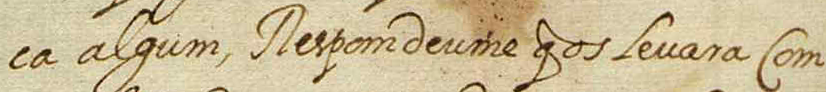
ca algum, Respomdeume q̄ os leuara Com
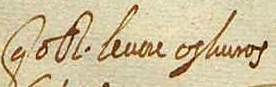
q̄ o R. leuou os liuros
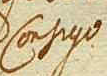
Consigo
